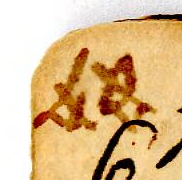40
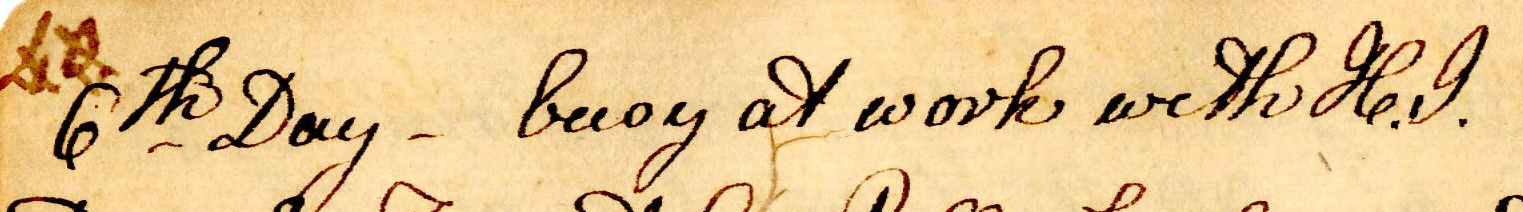6^th Day- busy at work with H. I.
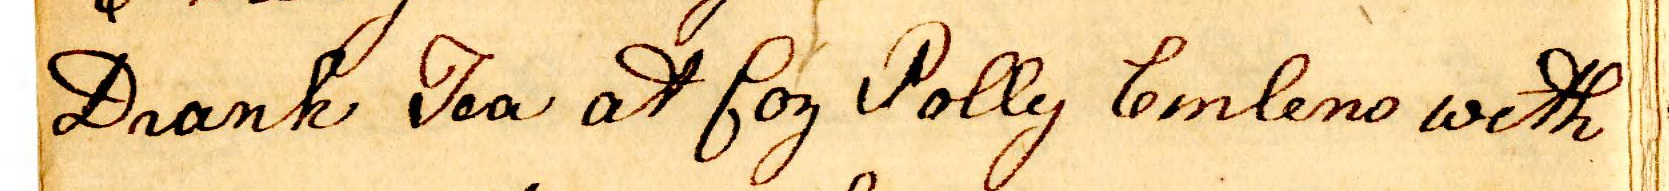Drank Tea at Coz Polly Emlens with
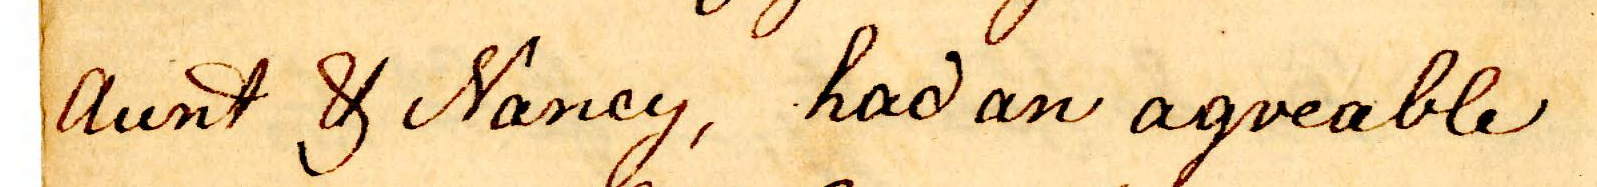Aunt & Nancy, had an agreable
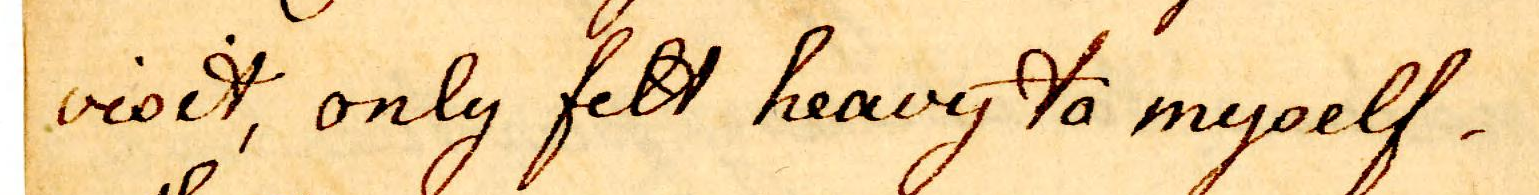visit, only felt heavy to myself-
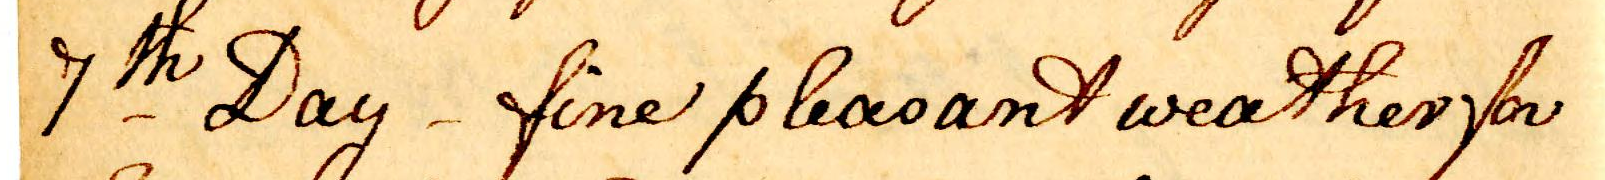7^th Day- fine pleasant weather for
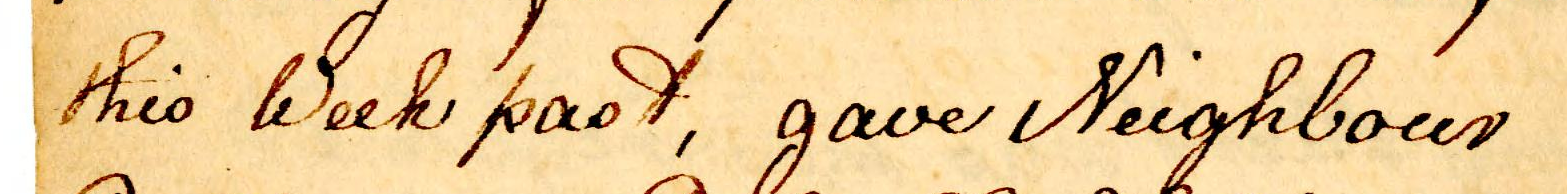this Week past, gave Neighbour
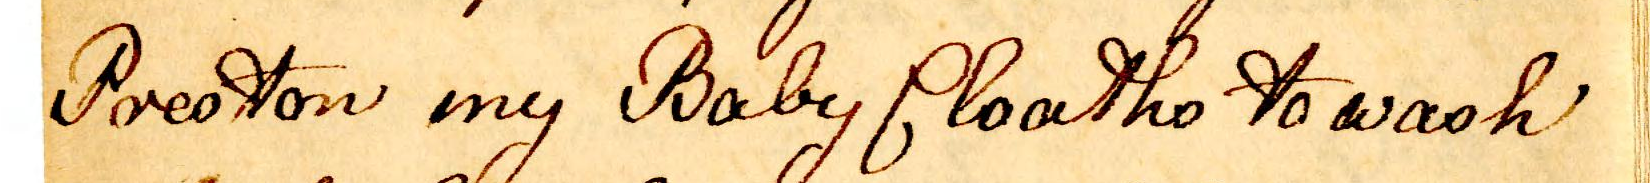Preston my Baby Cloaths to wash
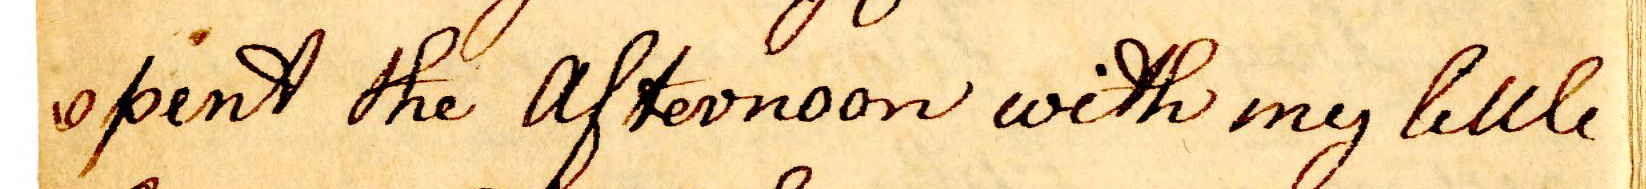spent the Afternoon with my little
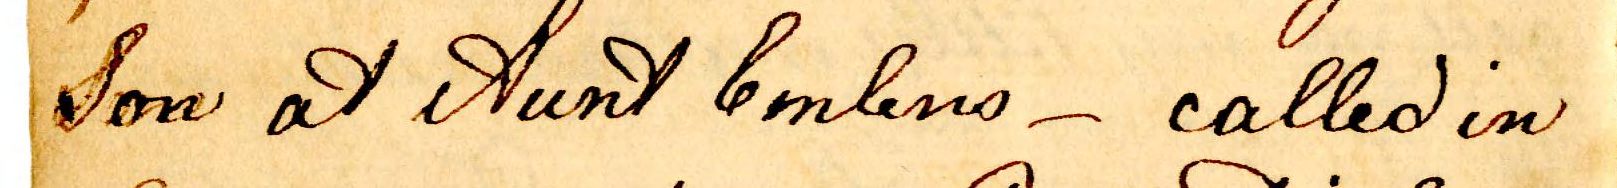Son at Aunt Emlens- called in
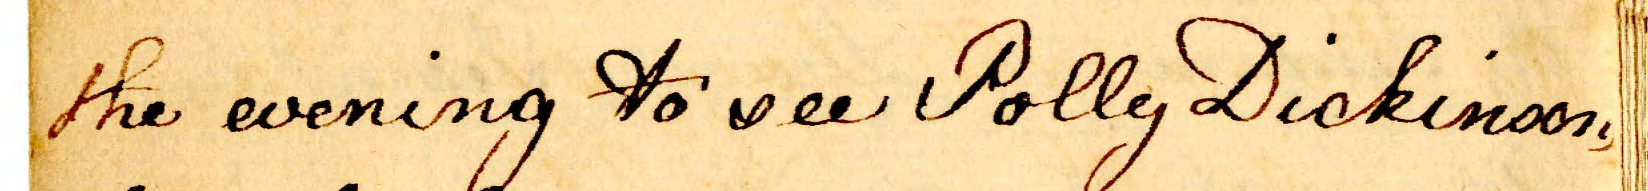the evening to see Polly Dickinson
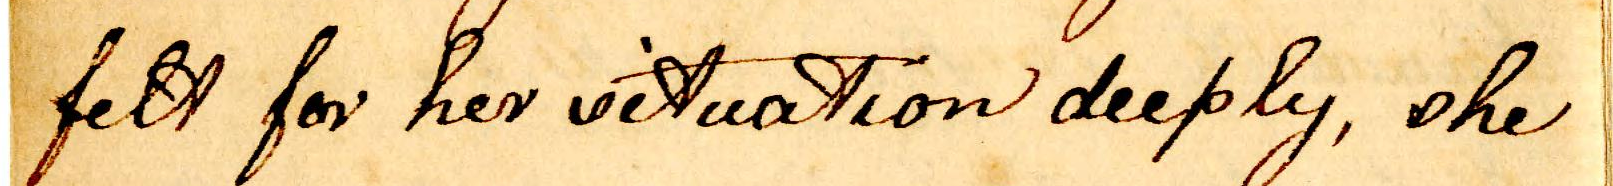felt for her situation deeply, she
